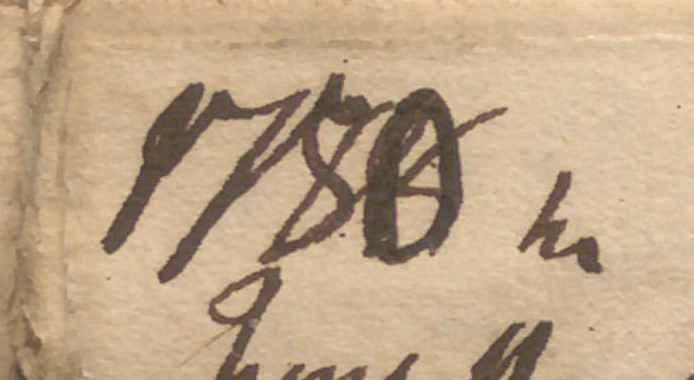1780
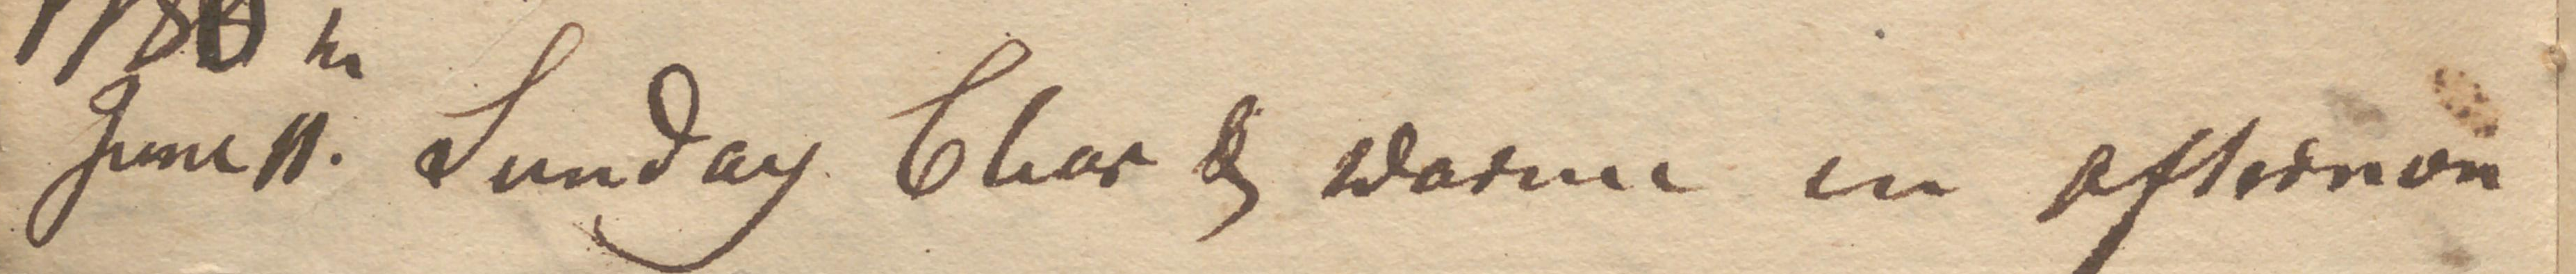June 11^th. Sunday Clear & warme in afternon
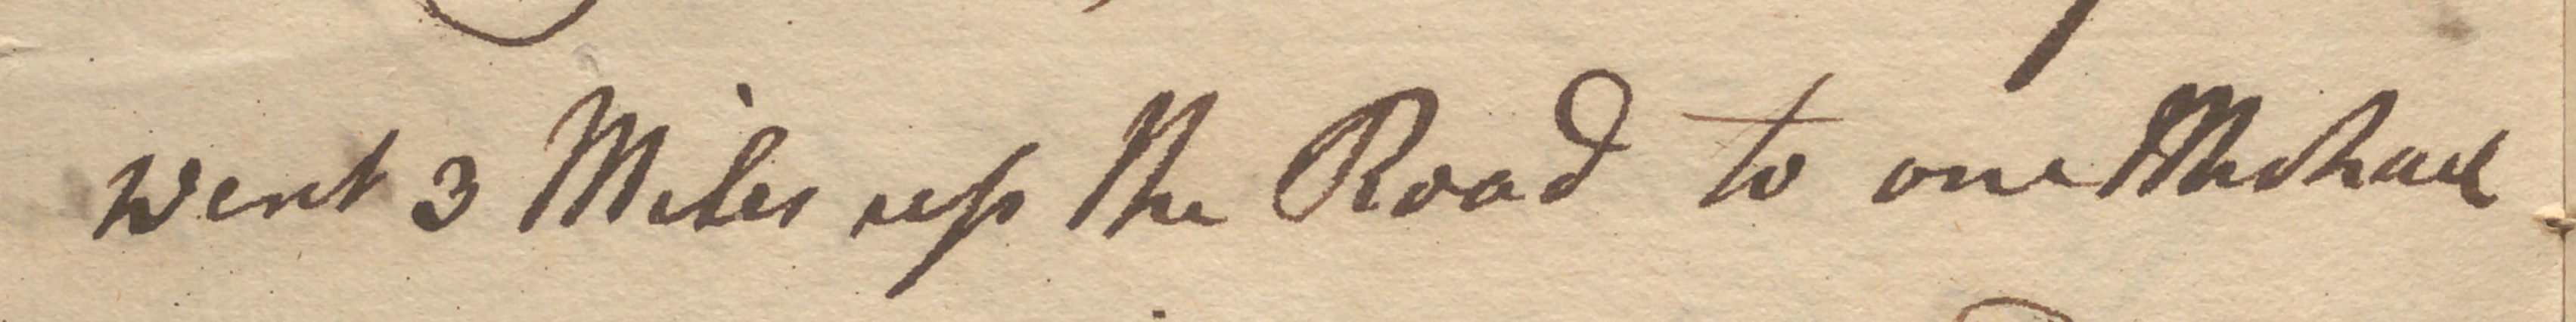went 3 Miles up the Road to one Michael
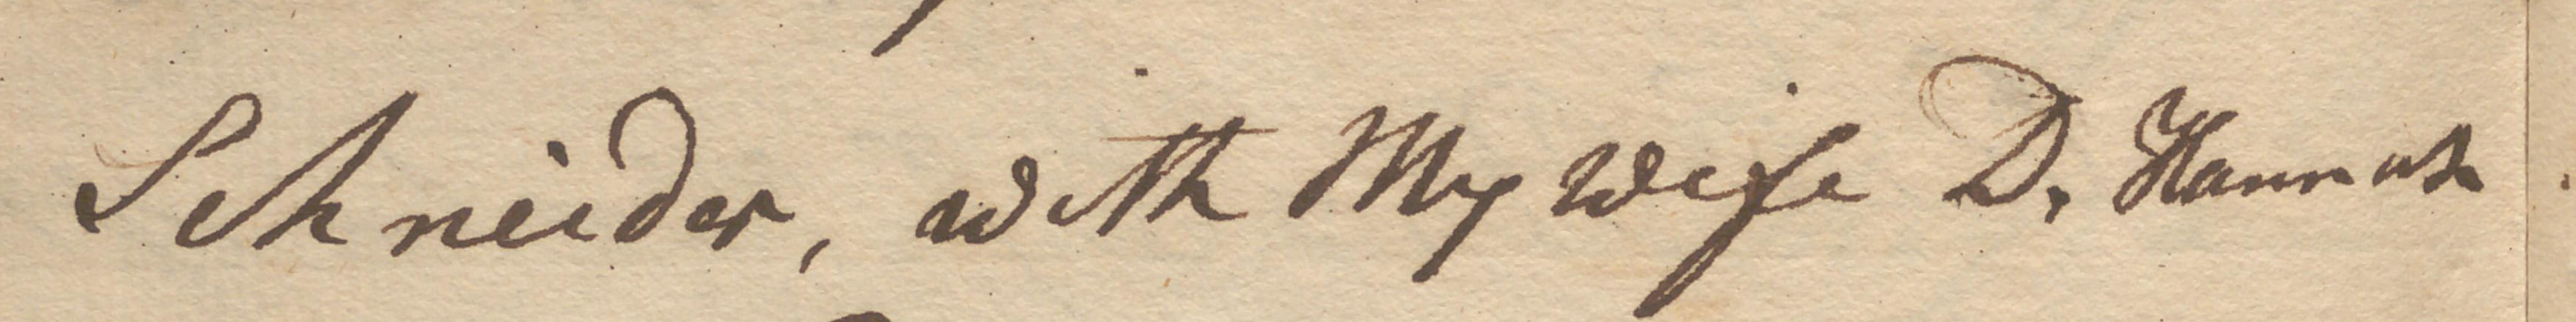Schneider, with My wife D. Hannah
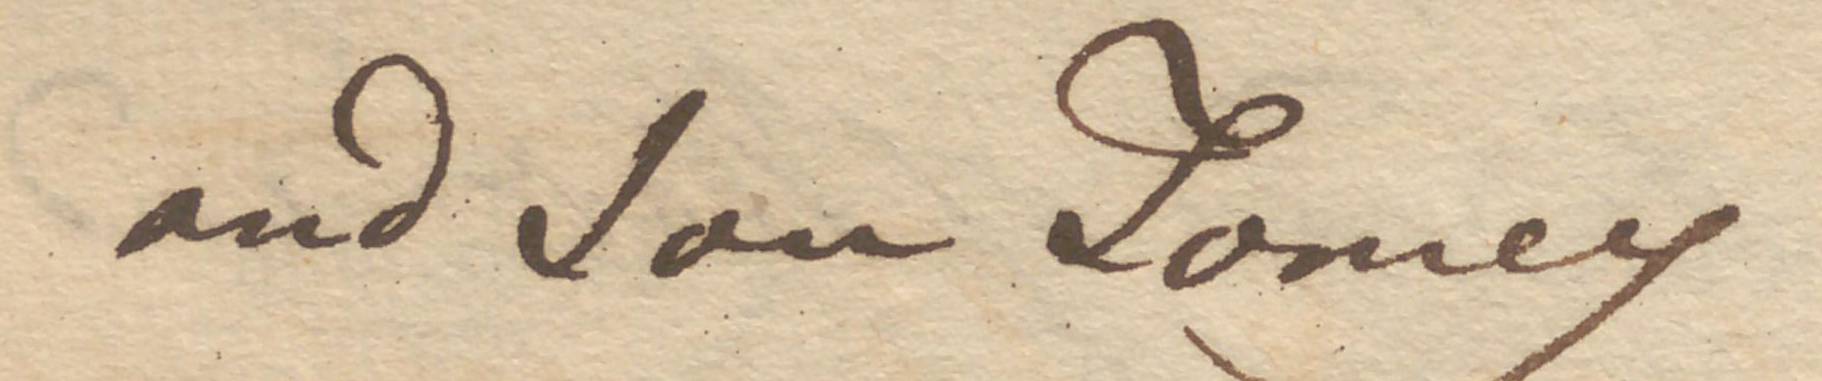and son Tomey
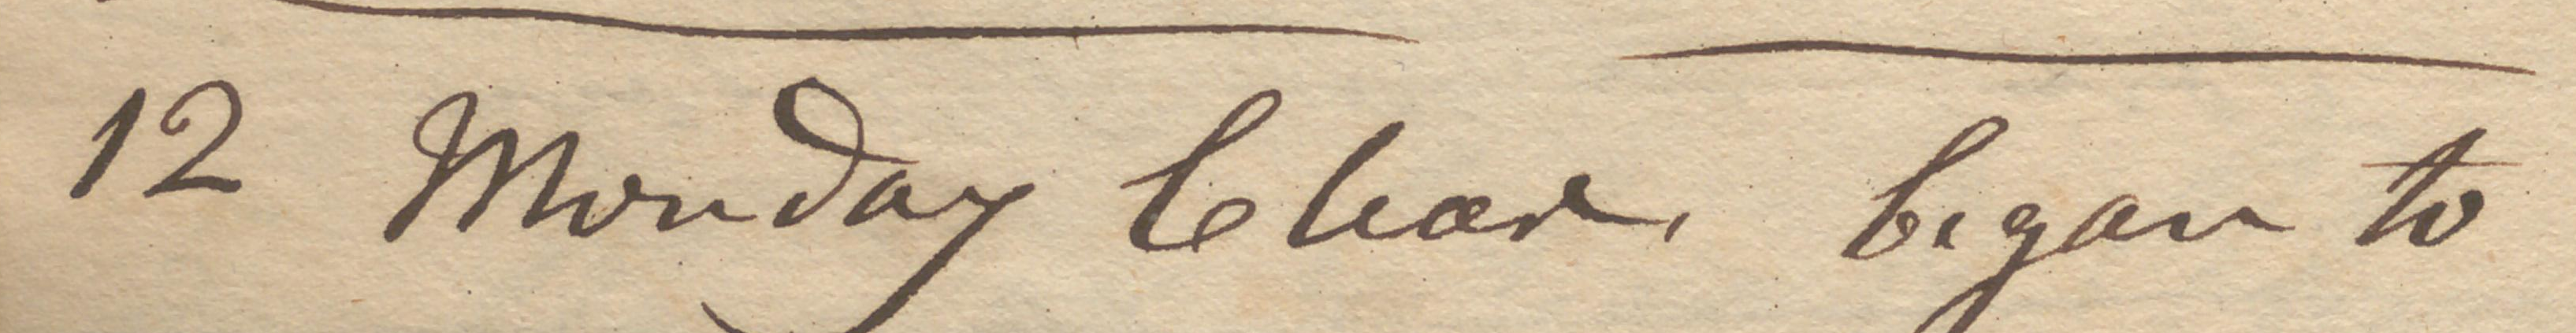12 Monday Clear, began to
